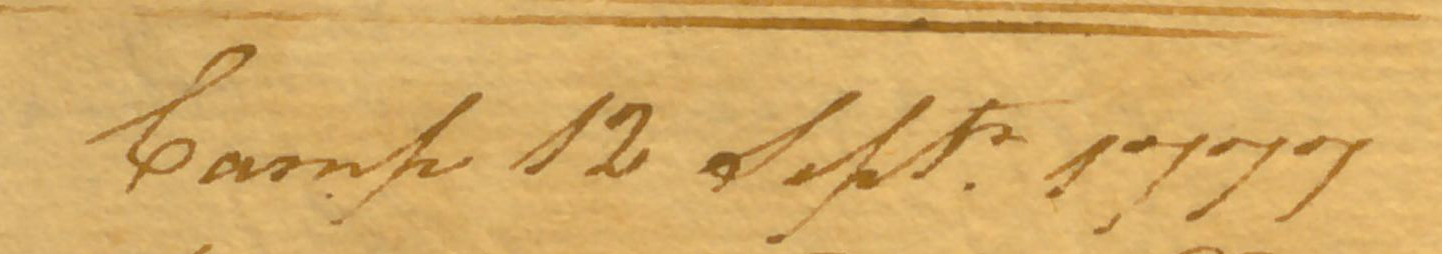Camp 12 Sept^r. 1777
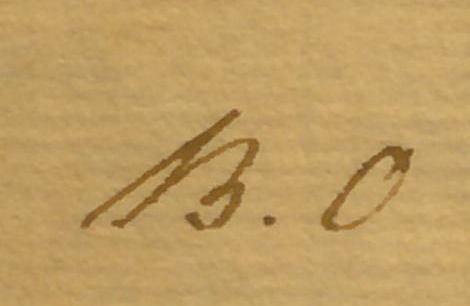B.O
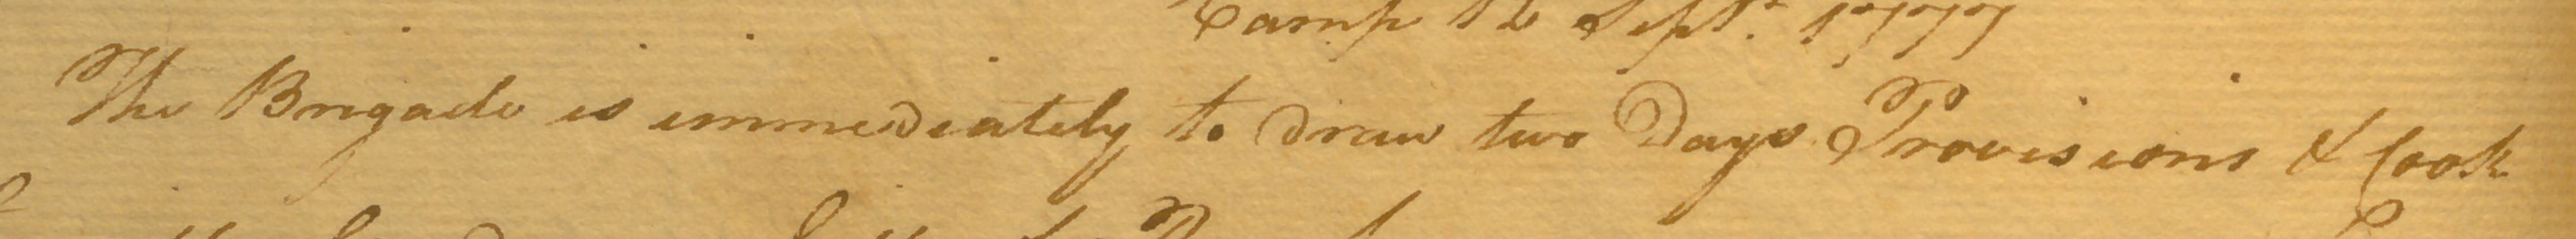The Brigade is immediately to draw two Days Provisions & Cook
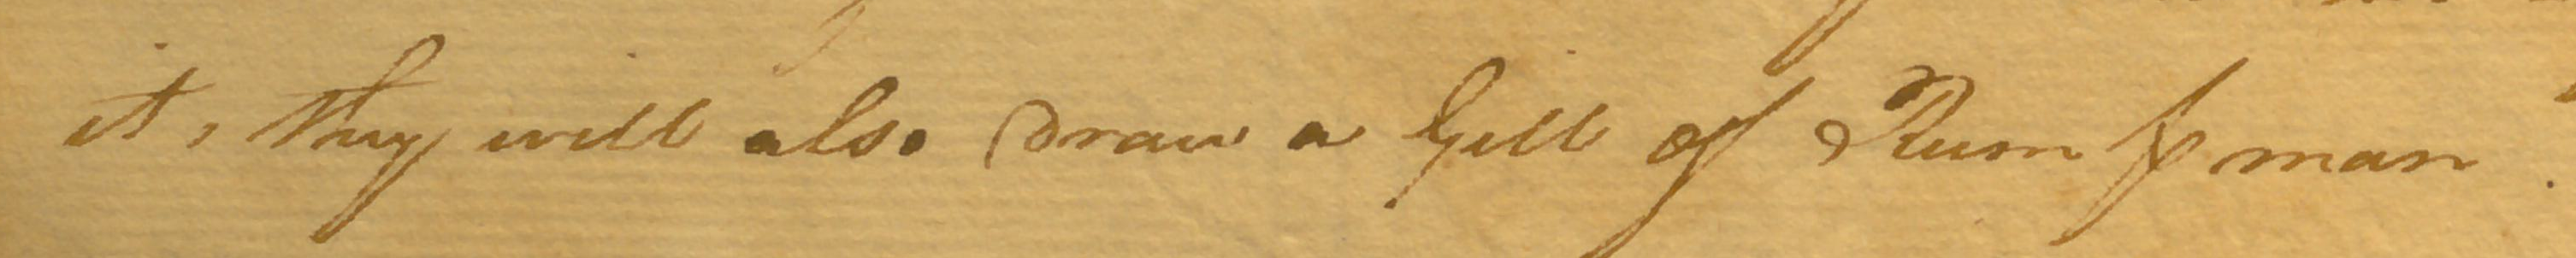it, they will also draw a Gill of Rum per man
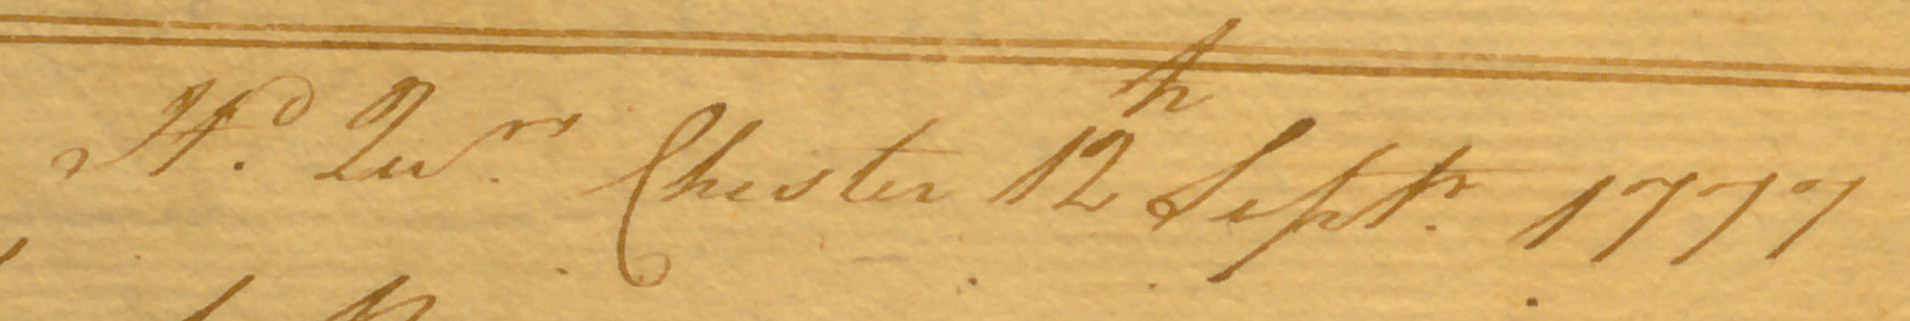H^d. Qu^rs. Chester 12^th Sept^r. 1777
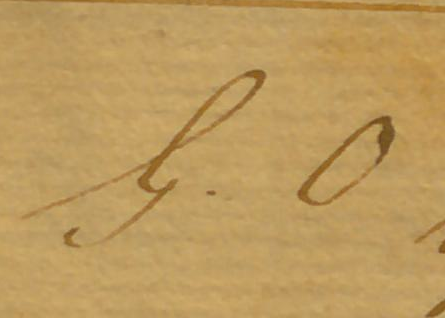G.O
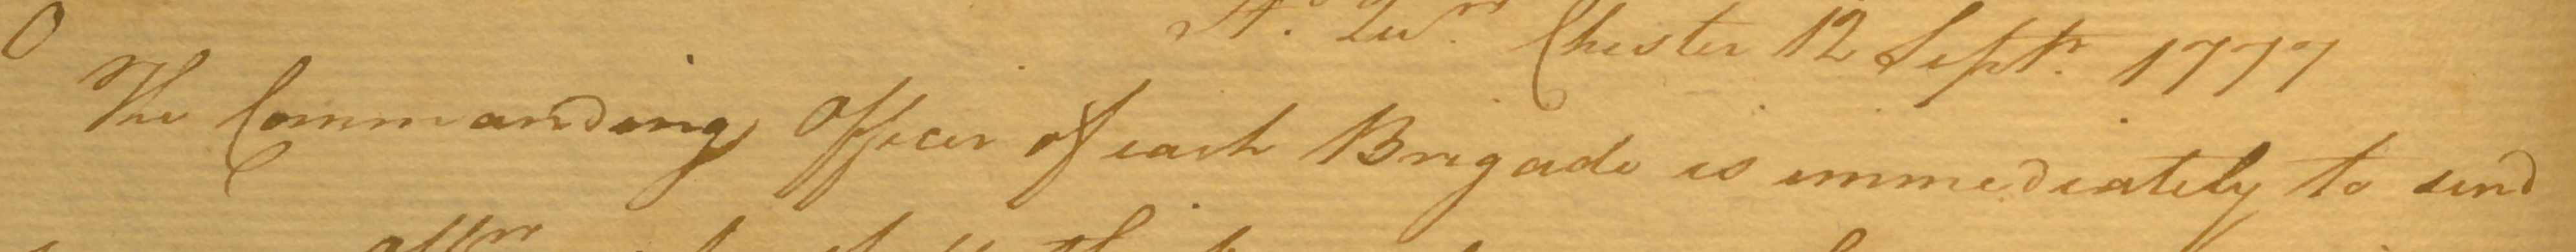The Commanding Officer of each Brigade is immediately to send
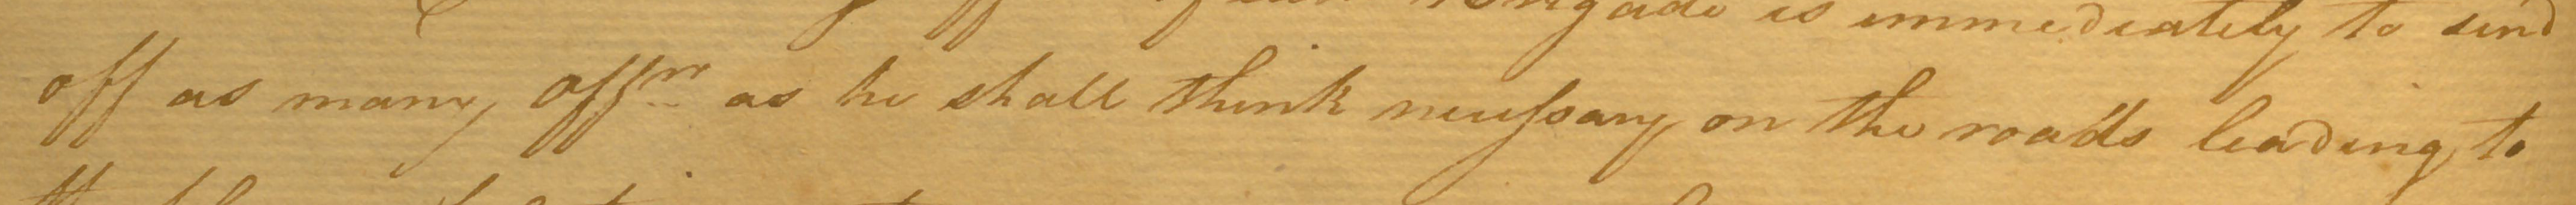off as many Off^rs as he shall think necessary on the roads leading to
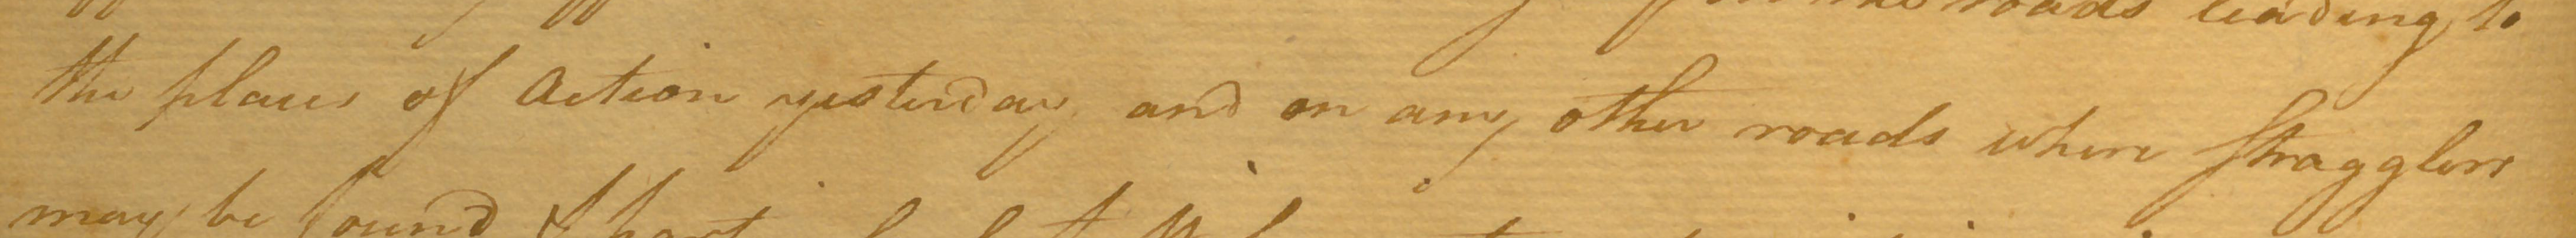the place of Action yesterday and on any other roads where Stragglers
